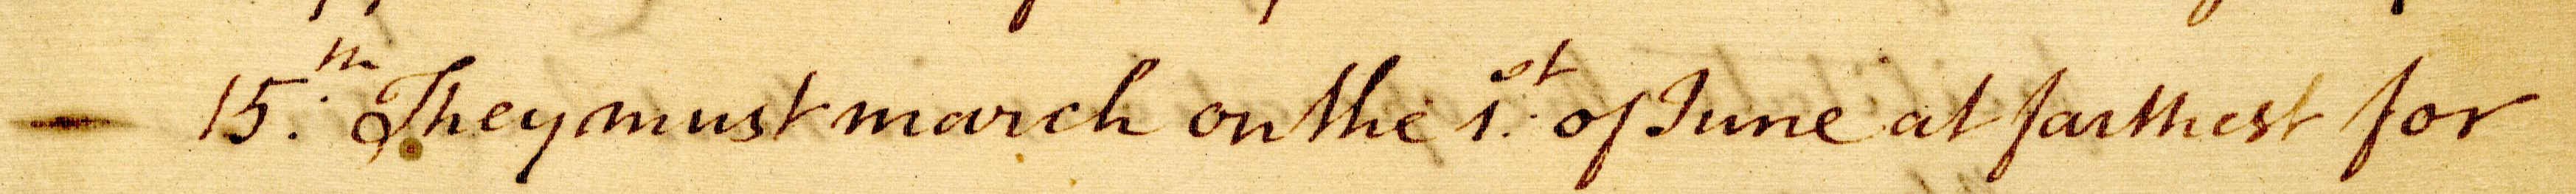15^th: They must march on the 1^st: of June at farthest for
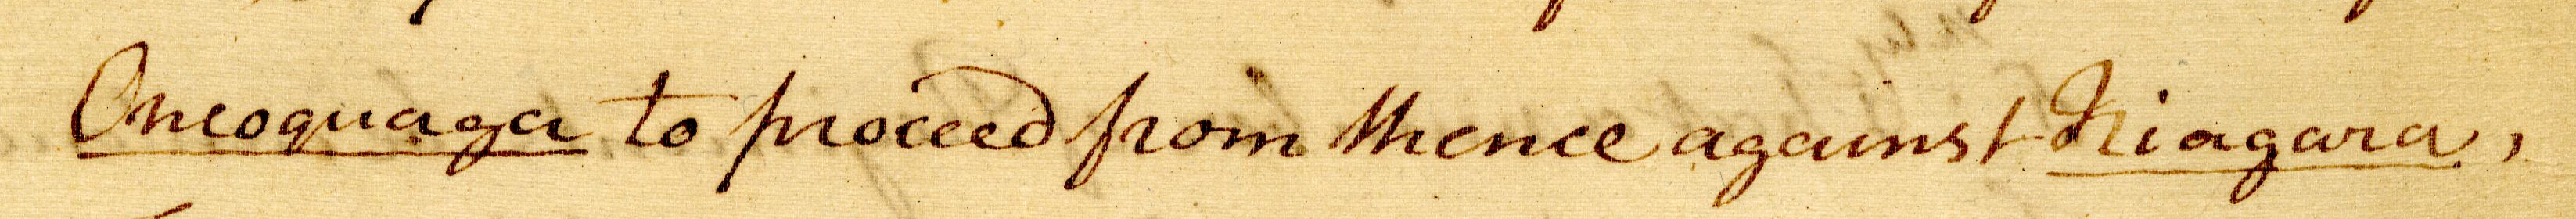Oncoguaga to proceed from thence against Niagara,
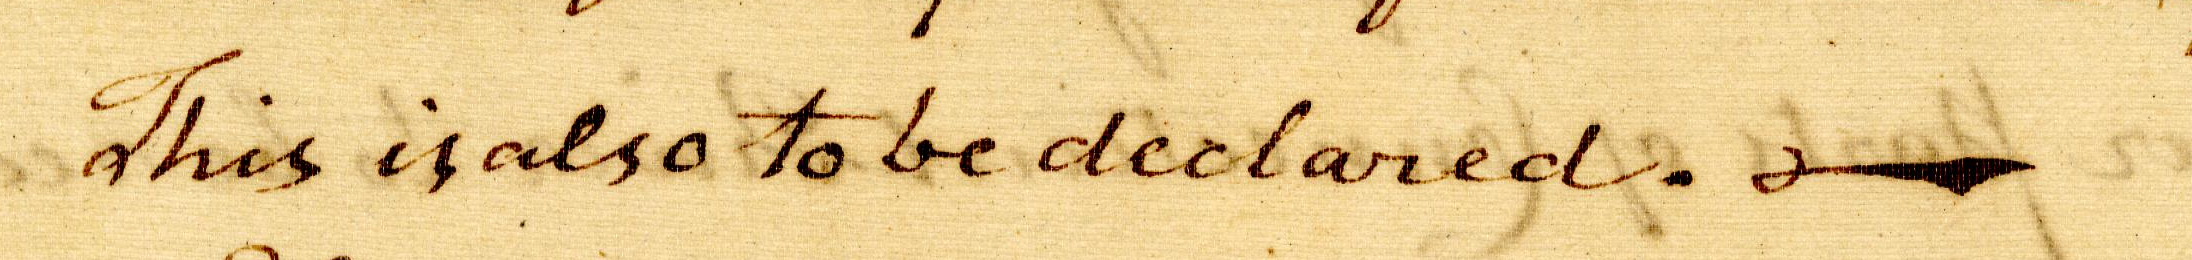This is also to be declared.-
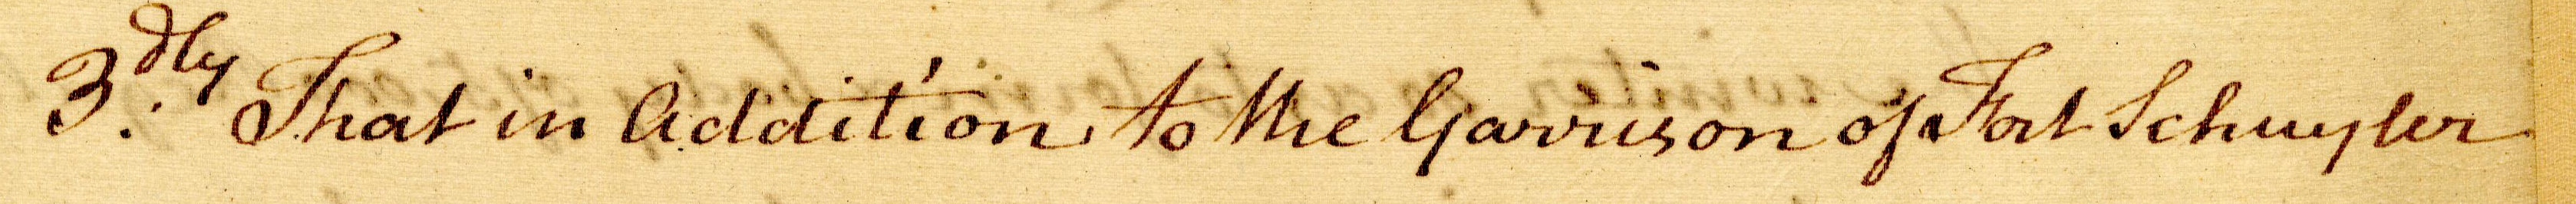3^dly: That in Addition to the Garrison of Fort Schuyler
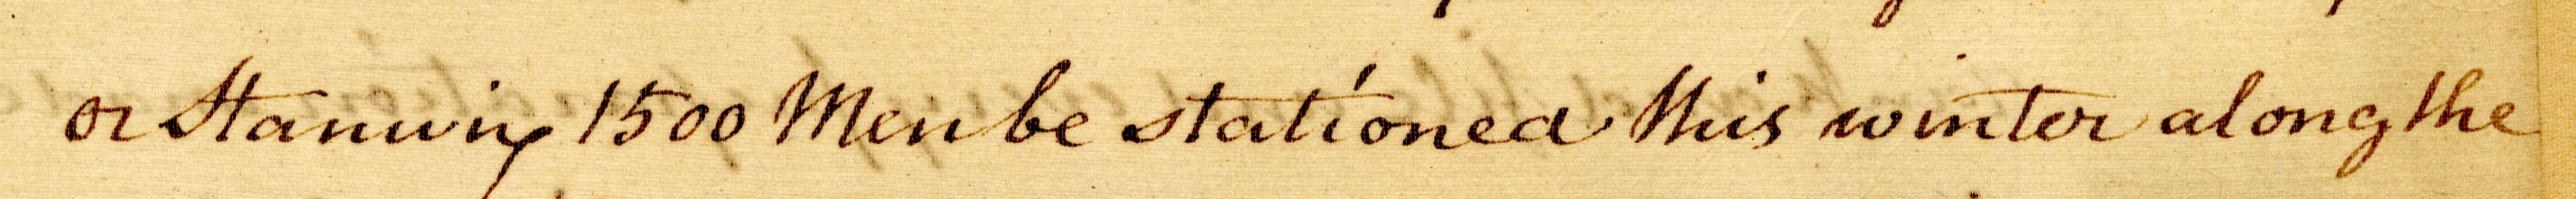or Stanwix 1500 Men be stationed this winter along the
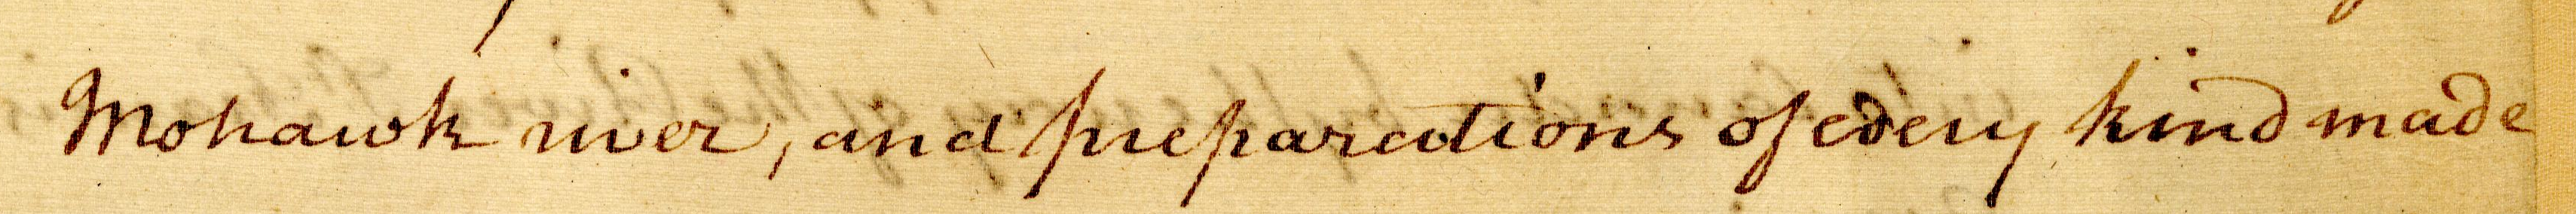Mohawk river, and preparations of every kind made
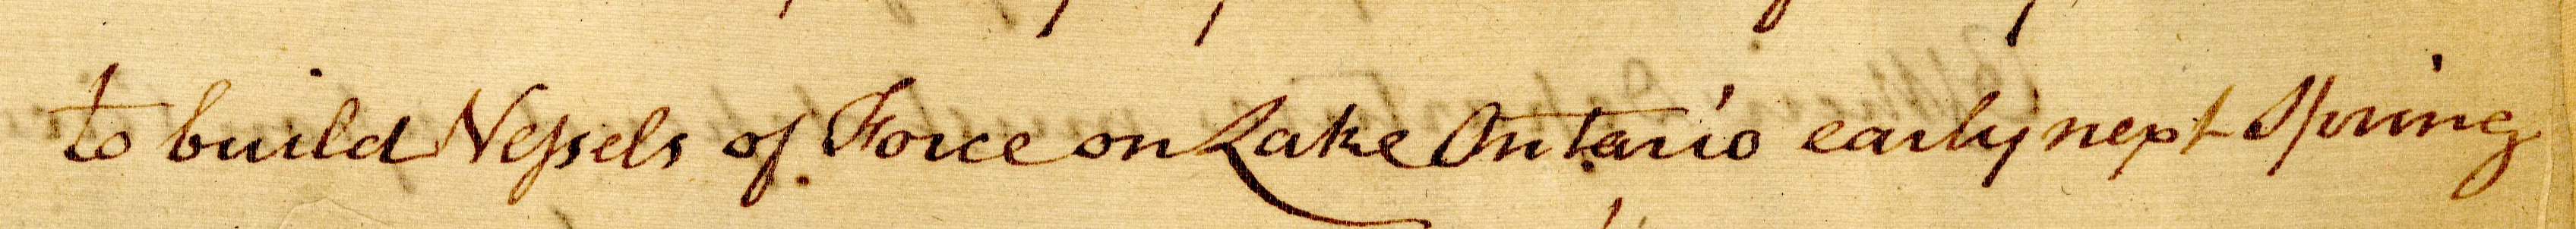to build Vessels of Force on Lake Ontario early next Spring
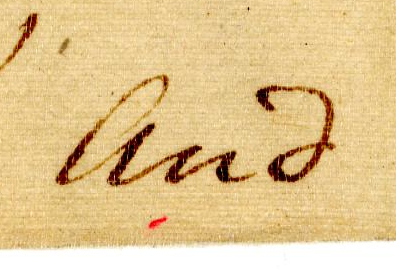And
